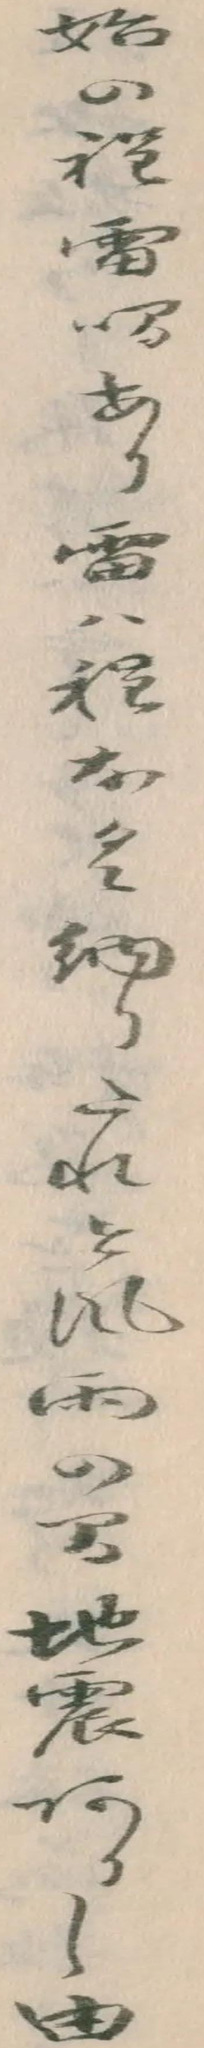始の程雷鳴あり雷は程なく納りこれと風雨の間地震ありし由
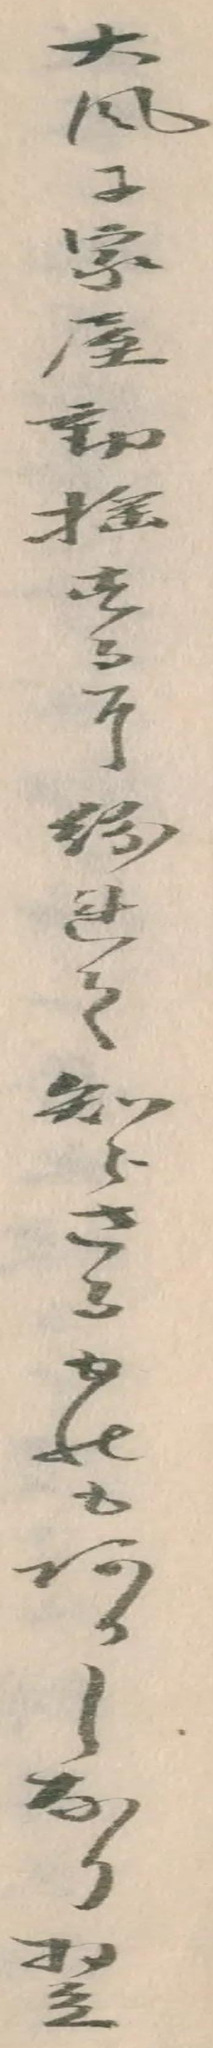大風に家屋動揺するに紛れて知らさるものもありしなり翌
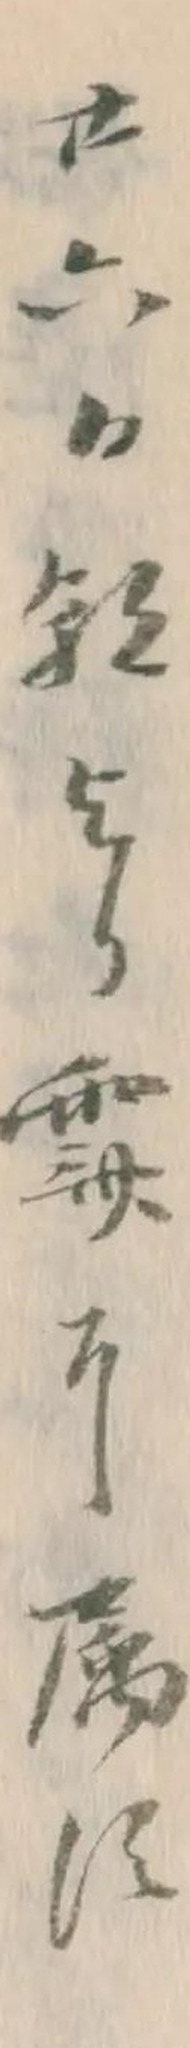廿六日朝より霽に属す
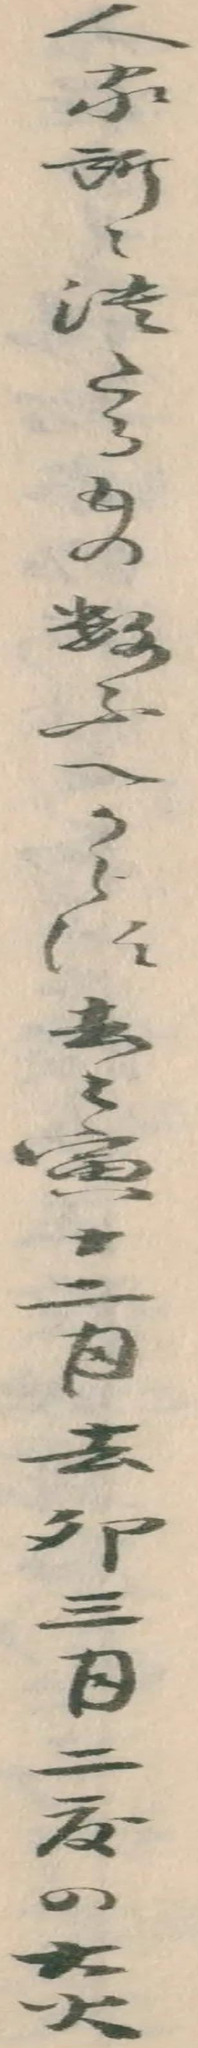人家所々潰たるもの数ふへからす去々寅十二月去卯三月二度の大火

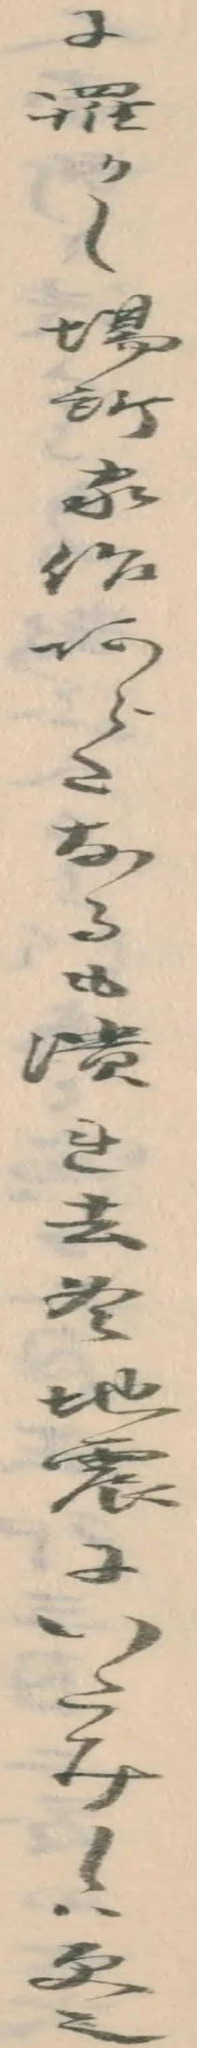に罹りし場所家作あらたなるも潰れ去冬地震にいたみしは更也
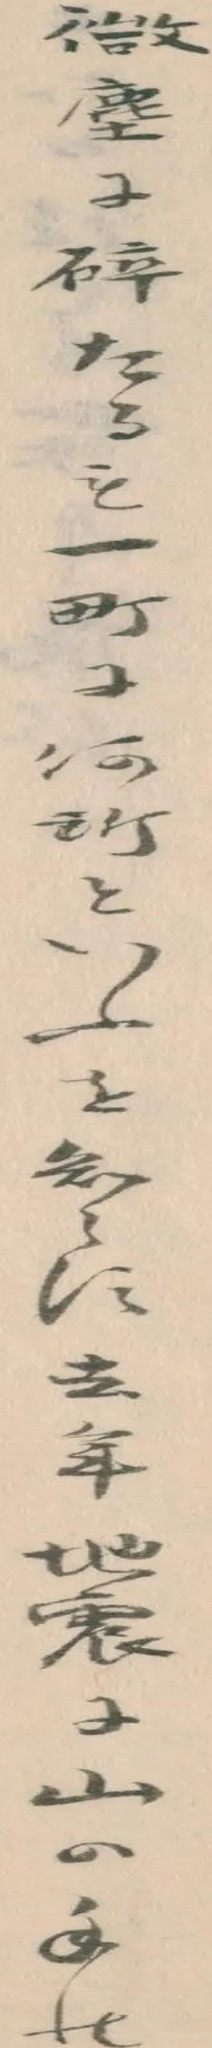微塵に砕たるも一町に何所といふを知らす去年地震に山の手の
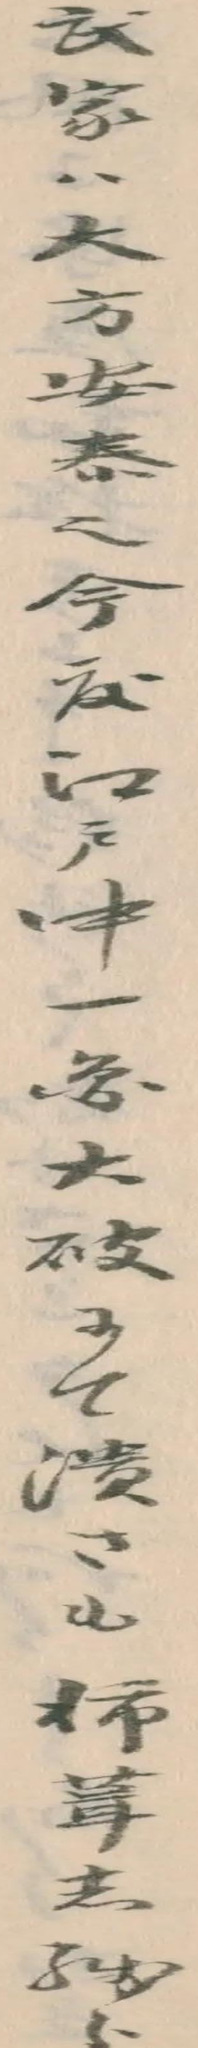武家は大方安泰也今度江戸中一円大破にて潰さも杮葺は残ら
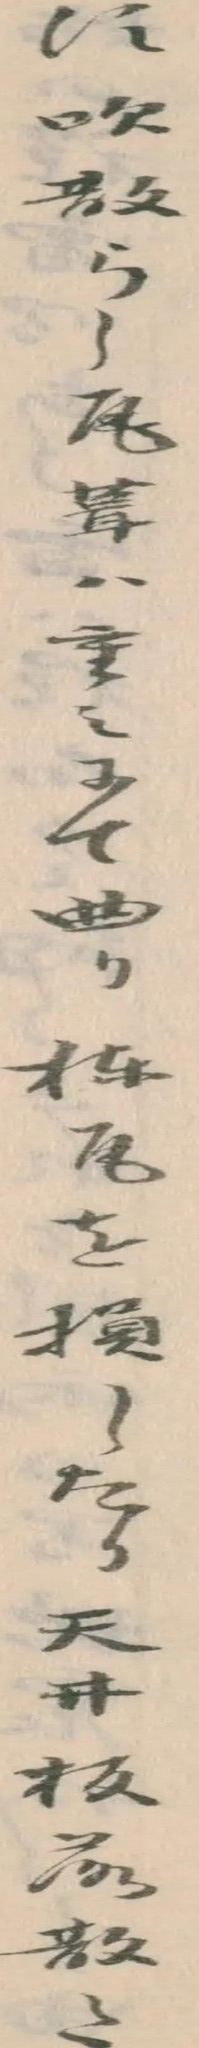す吹散らし瓦葺は重みにて曲り棟瓦を損したり天井板落散た
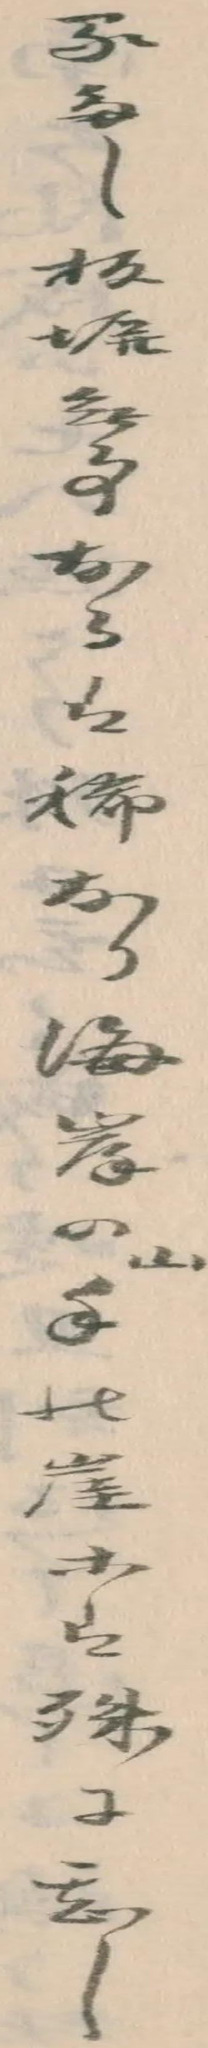る多し板塀無事なるは稀なり海岸の山手の崖等は殊に甚し
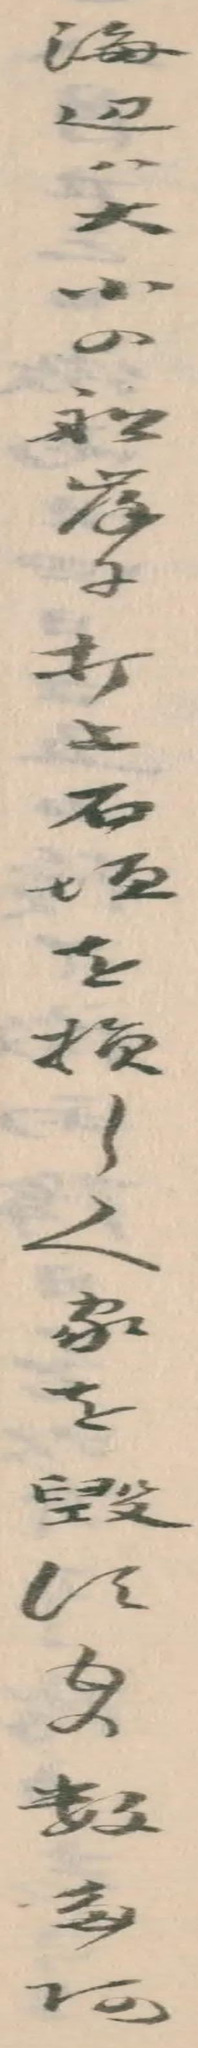海辺は大小の船岸に打上石垣を損し人家を毀すもの数多あ
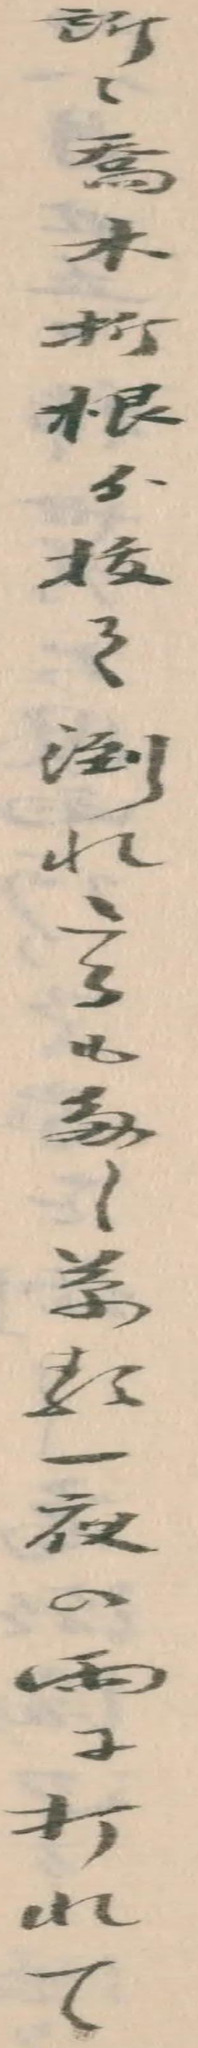所々喬木折根ゟ抜て倒れたるも多し草類一夜の雨に打れて
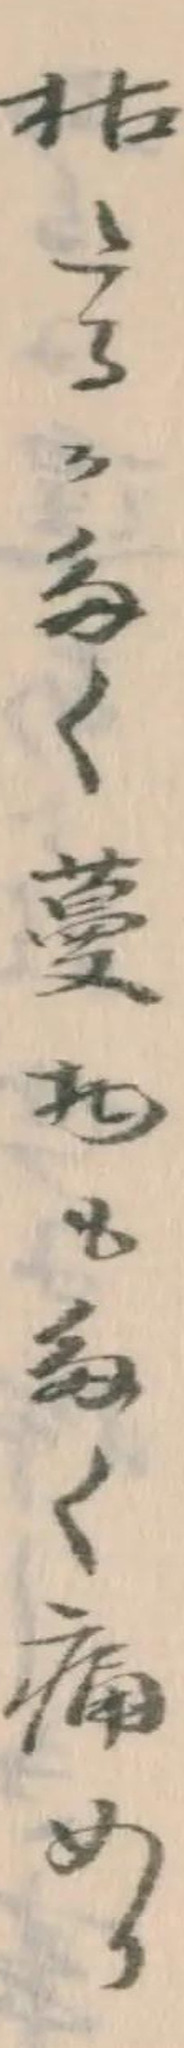枯たるか多く蔓物も多く痛めり
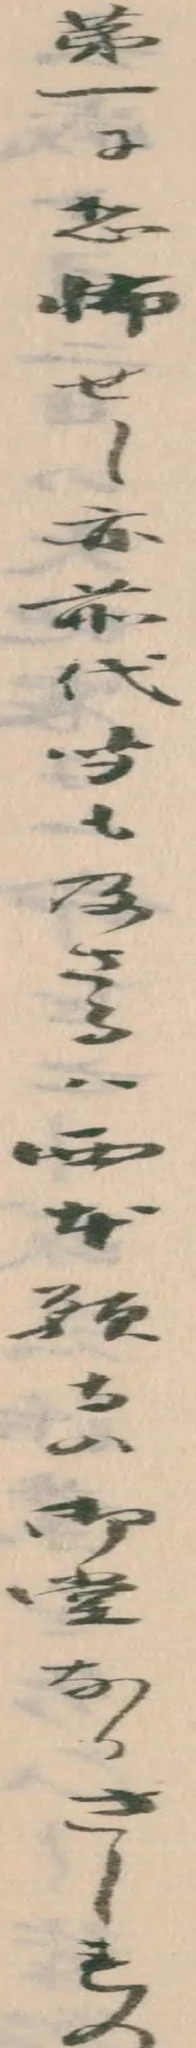第一に恐怖せし亦前代聞も及さるは西本願寺の御堂なりさしもの
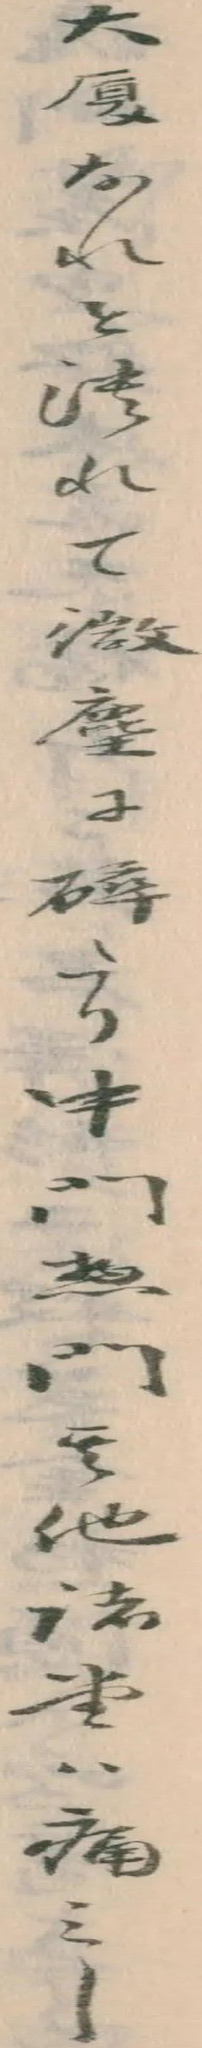大厦なれと潰れて微塵に砕たり中門惣門其他諸堂は痛みし
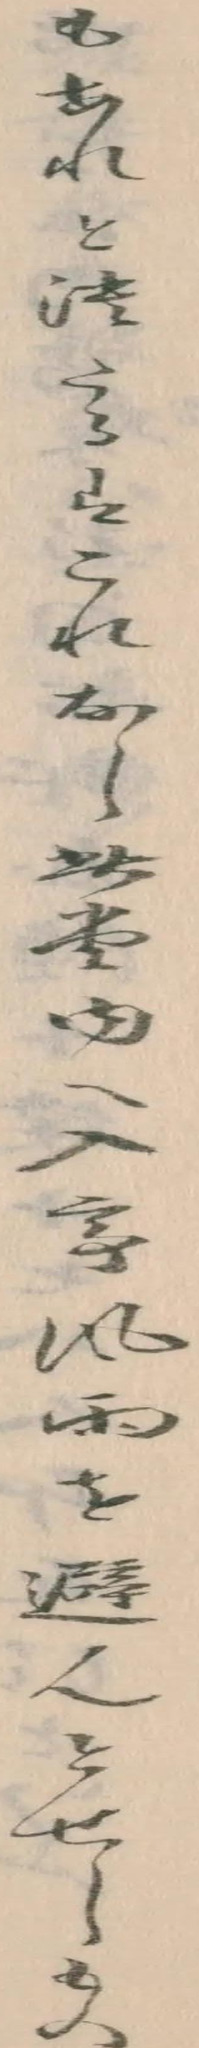もあれと潰たるはこれなし此堂内へ入て風雨を避んとせしもの
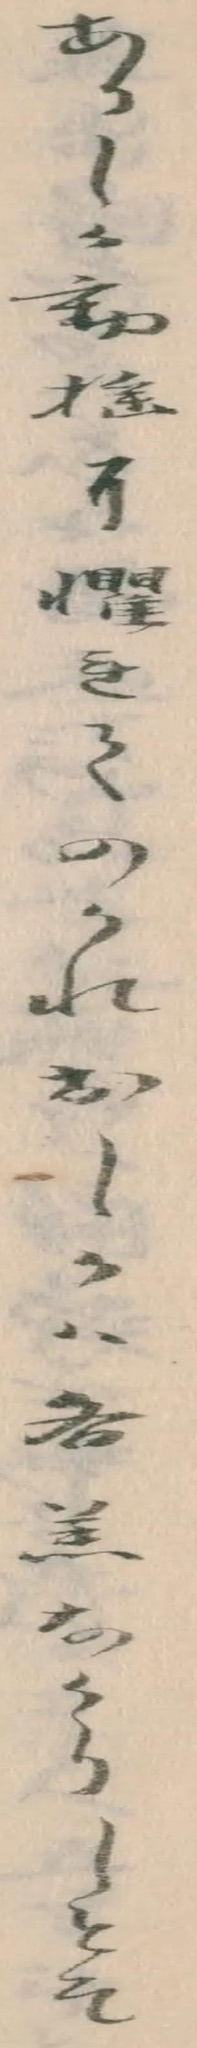ありしか動揺に懼れてのかれ出しかは各恙なかりしとそ
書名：地災撮要. 巻10(地震之部) 上,下
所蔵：国立国会図書館 National Diet Library, JAPAN
